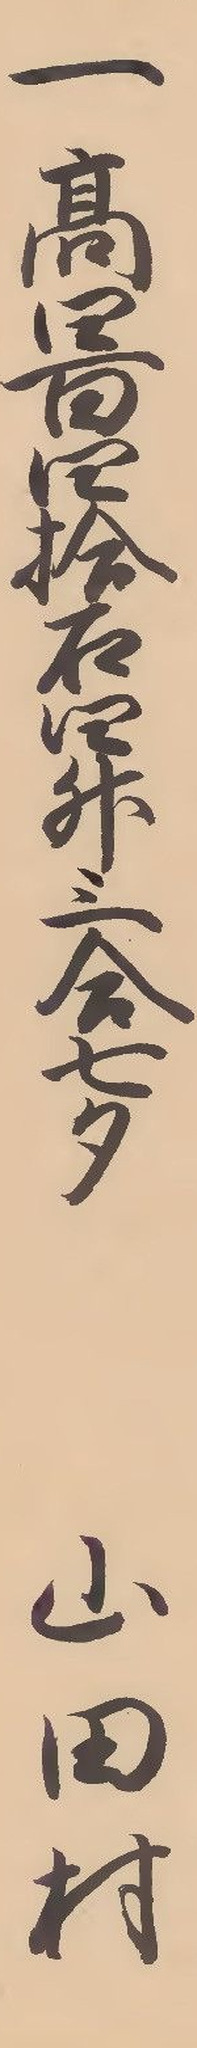一高四百四拾石四升三合七勺山田村

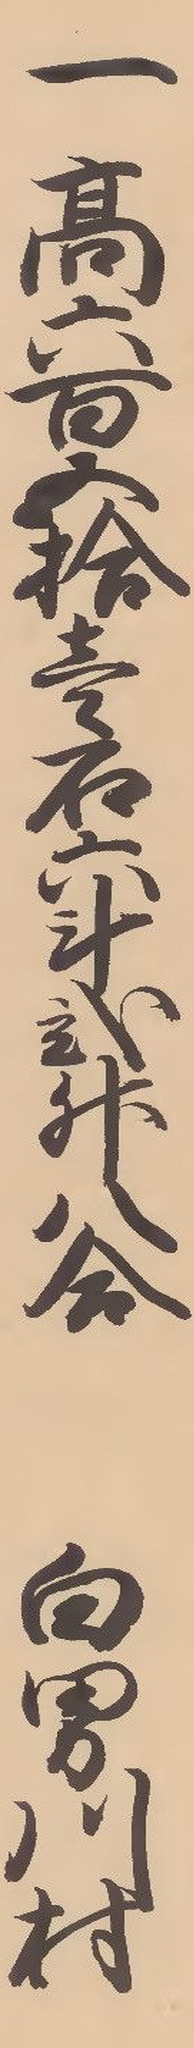一高六百五拾壱石六斗弐升八合白男川村
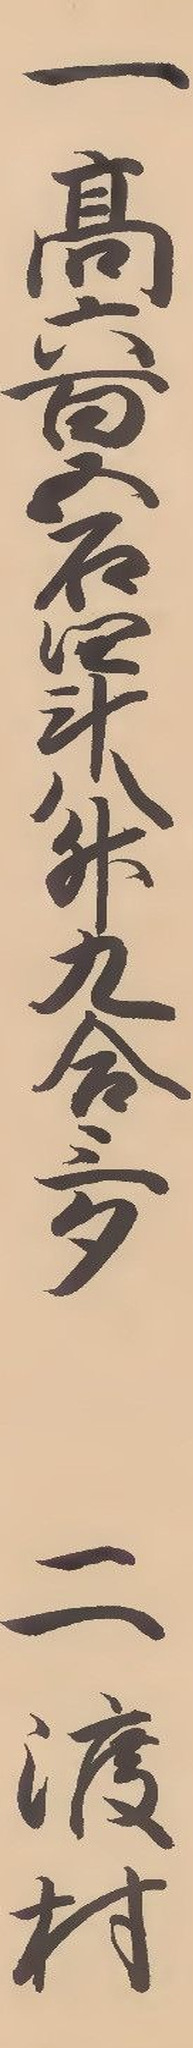一高六百五石四斗八升九合三勺二渡村
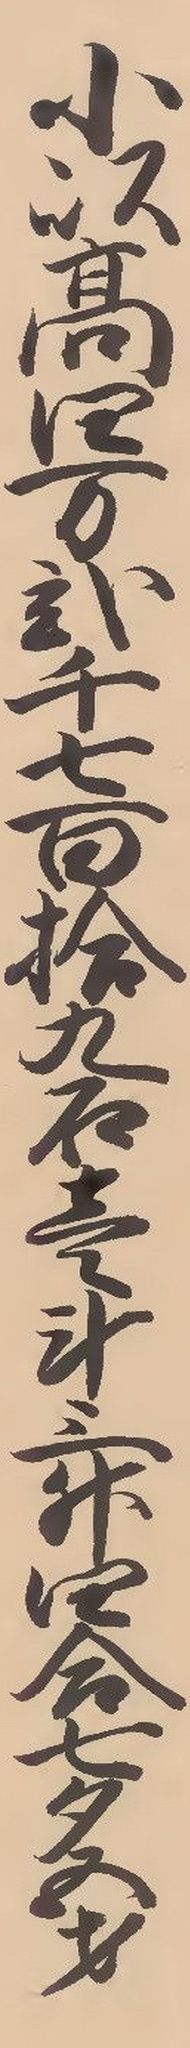小以高四万弐千七百拾九石壱斗三升四合七勺五才
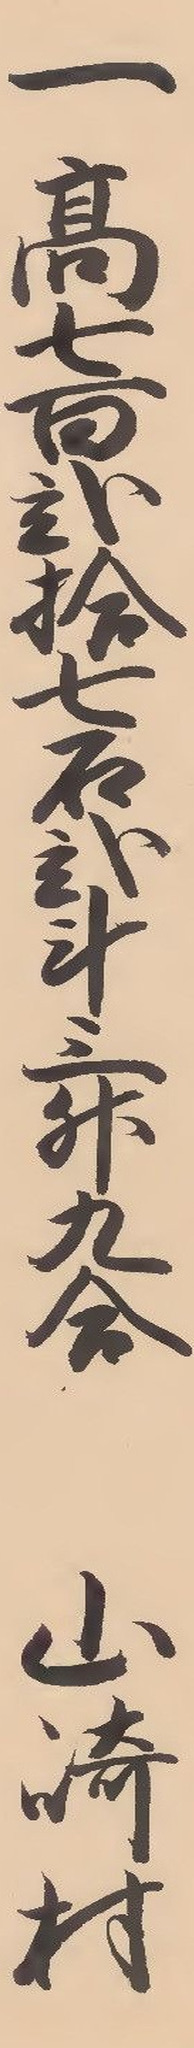一高七百弐拾七石弐斗三升九合山崎村
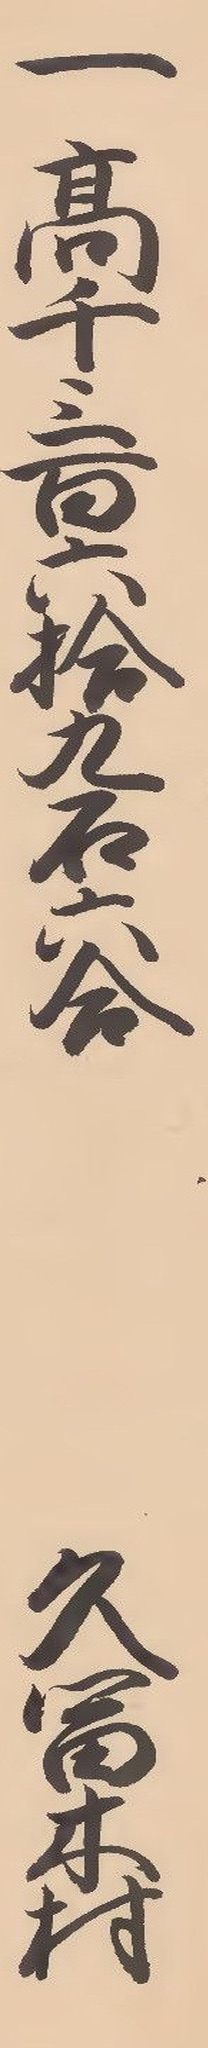一高千三百六拾九石六合久富木村
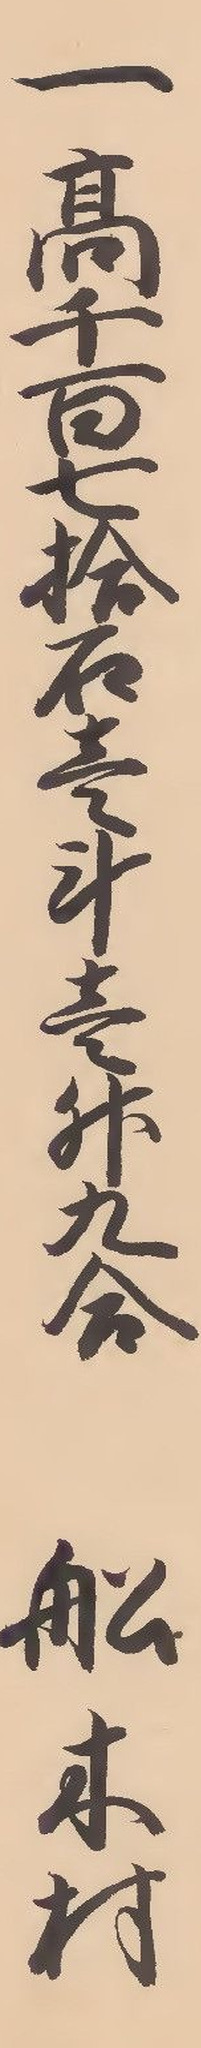一高千百七拾石壱斗壱升九合船木村

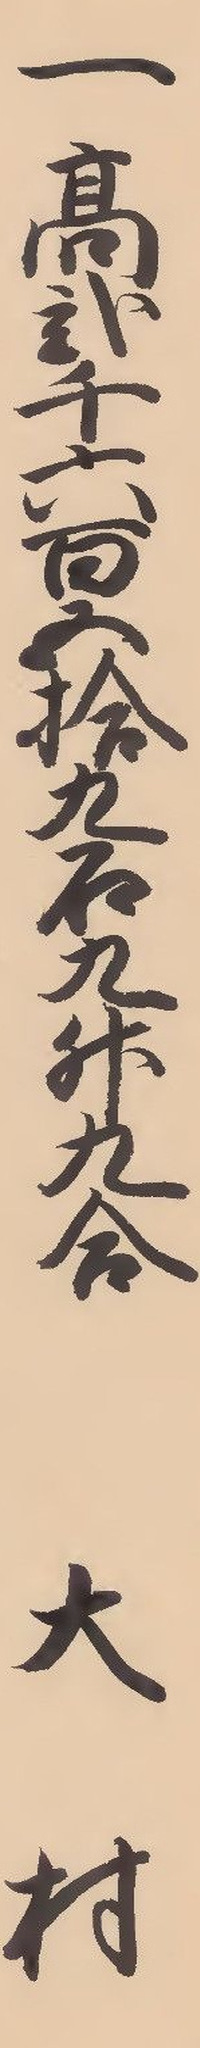一高弐千六百五拾九石九升九合大村
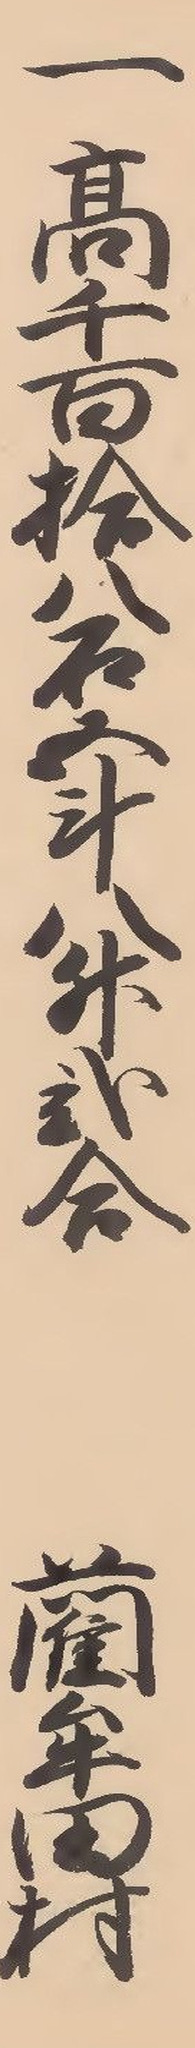一高千百拾八石五斗八升弐合藺牟田村
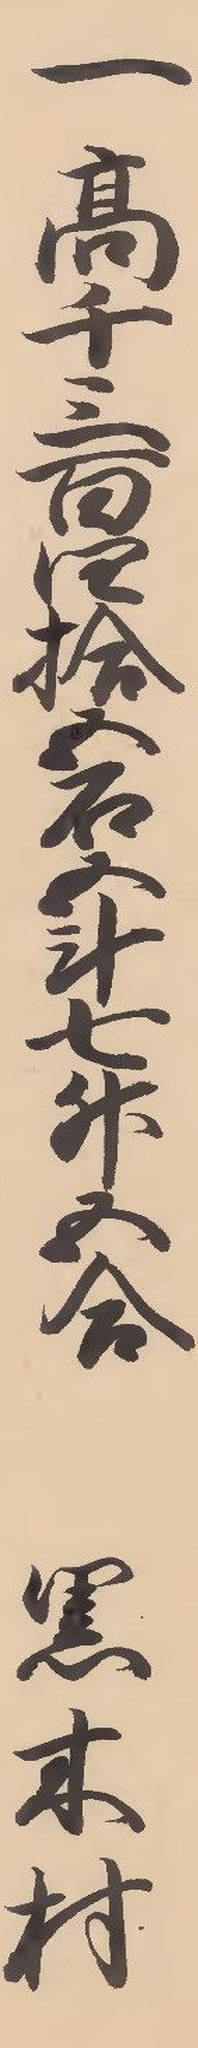一高千三百四拾五石五斗七升五合黒木村
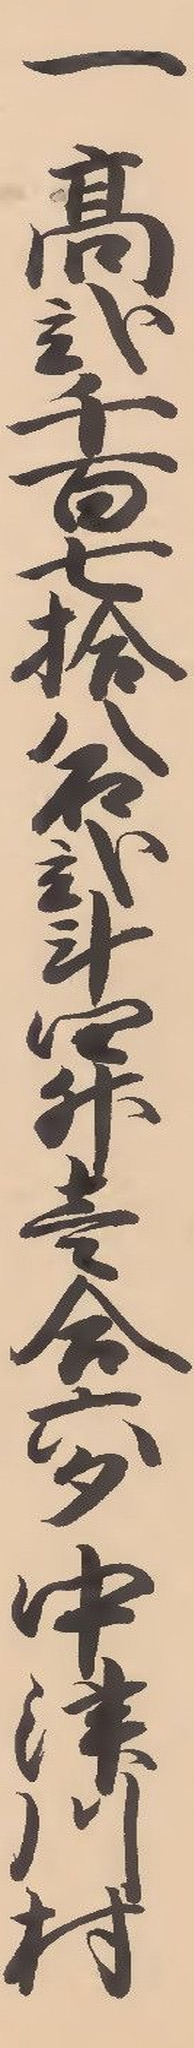一高弐千百七拾八石弐斗四升壱合六勺中津川村
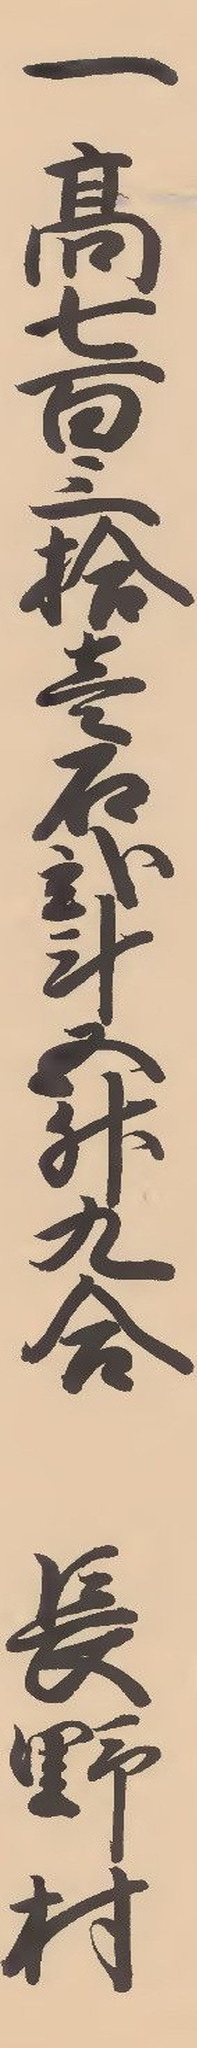一高七百三拾壱石弐斗五升九合長野村
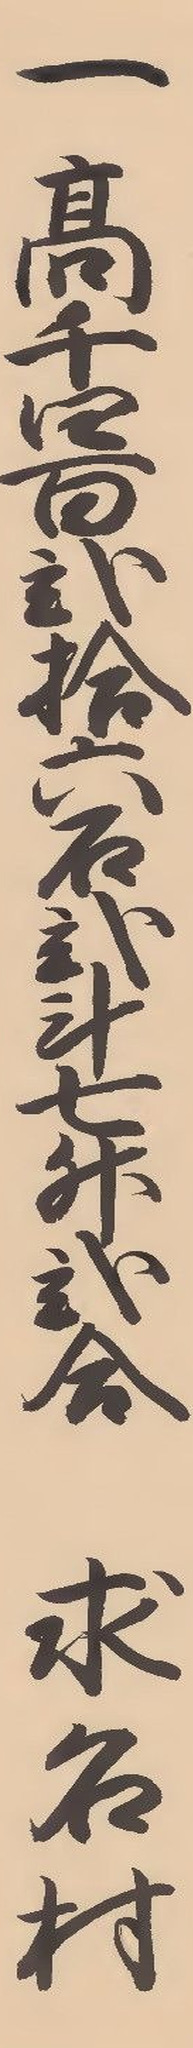一高千四百弐拾六石弐斗七升弐合求名村
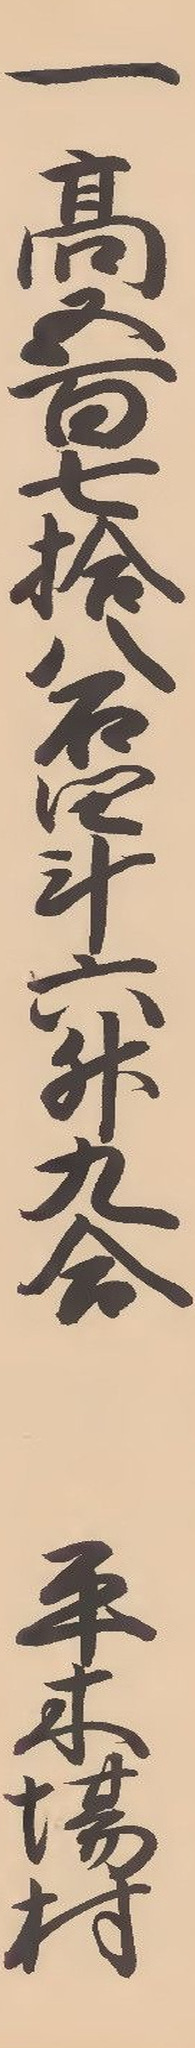一高五百七拾八石四斗六升九合平木場村
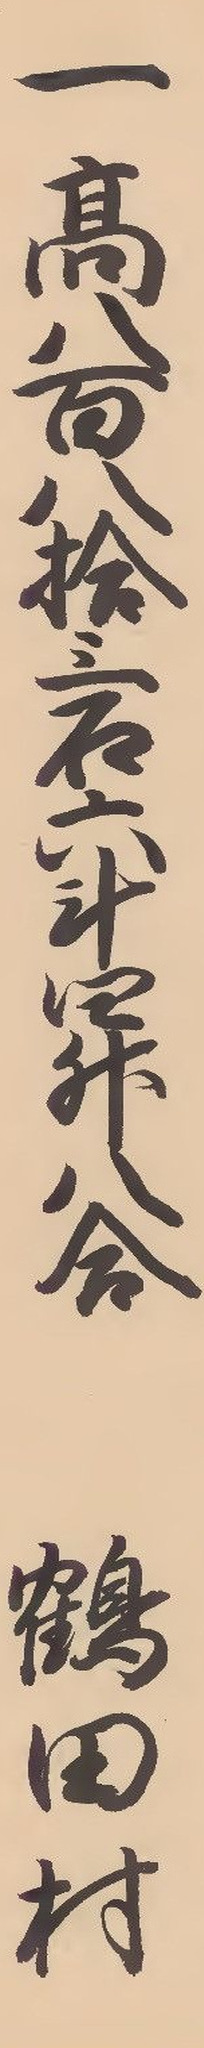一高八百八拾三石六斗四升八合鶴田村

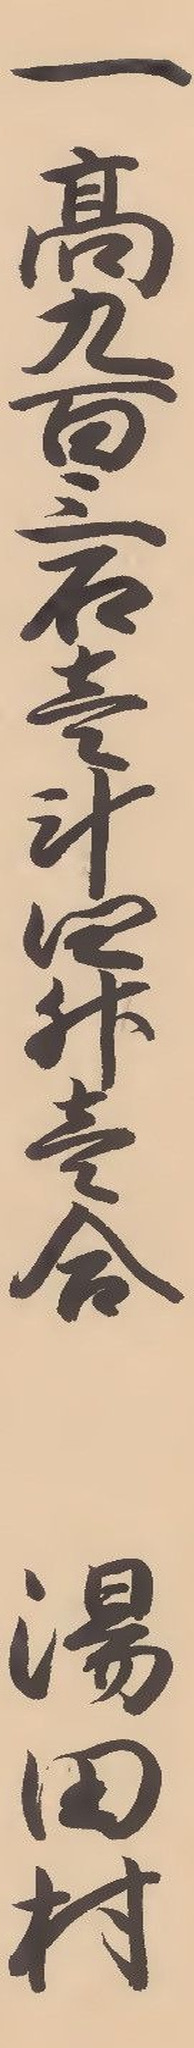一高九百三石壱斗四升壱合湯田村
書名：薩摩国郷帳
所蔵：国立公文書館 National Archives of Japan
